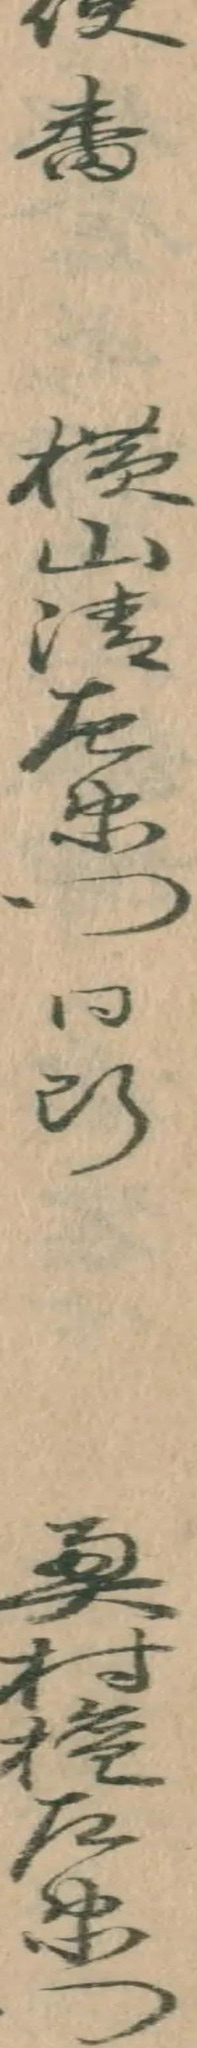使番横山清左衛門同断奥村権左衛門
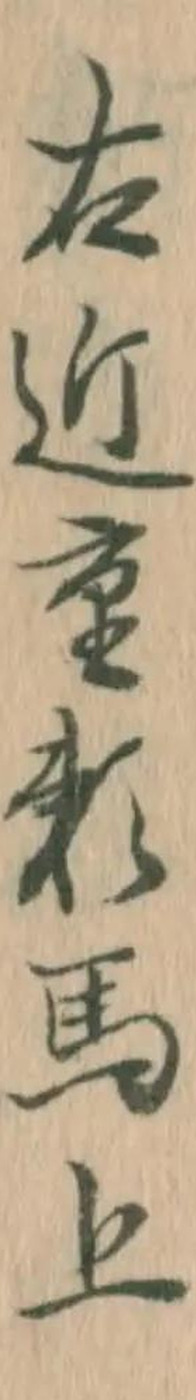右近重頼馬上
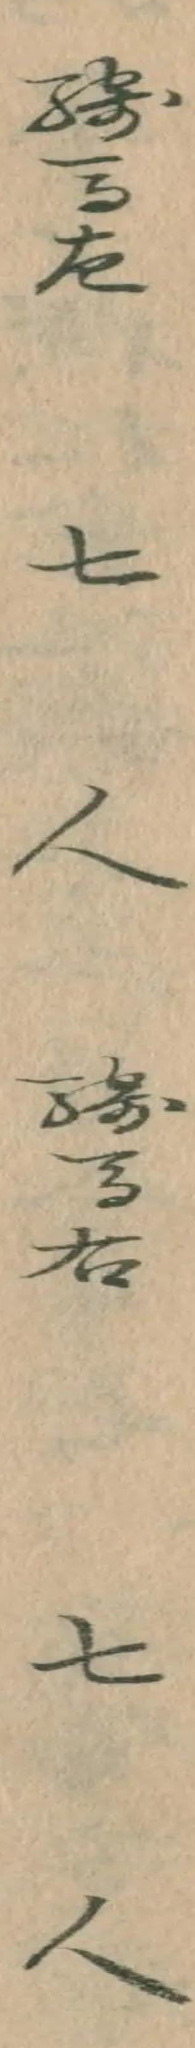騎馬左七人騎馬右七人
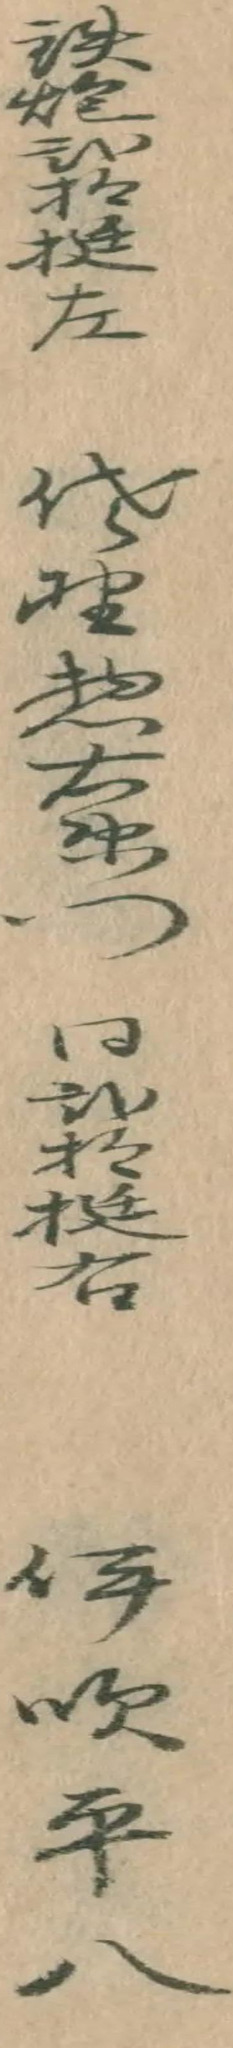鉄炮弐拾挺左佐野惣右衛門同弐拾挺右伊吹平八
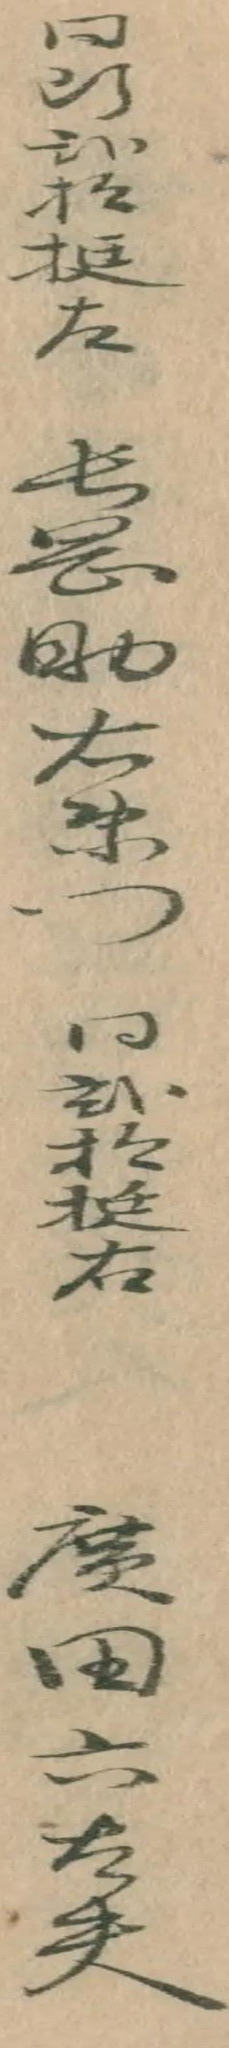同断弐拾挺左長岡助右衛門同弐拾挺右広田六太夫
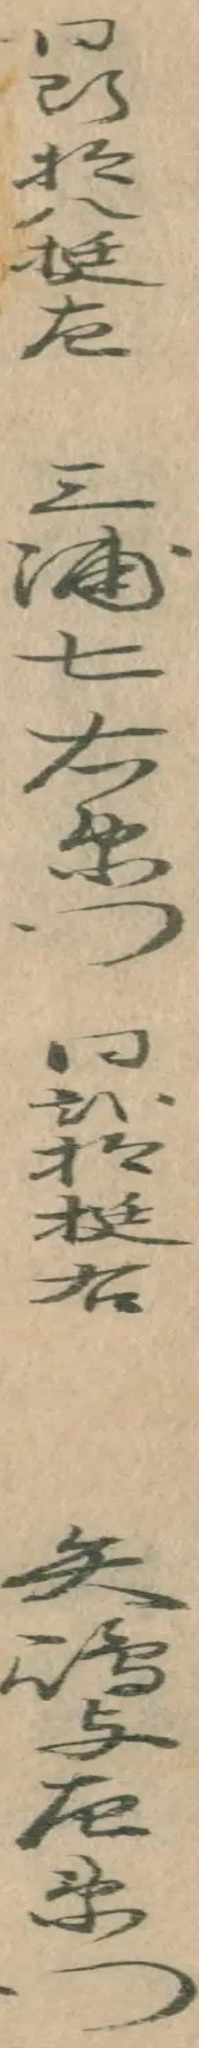同断拾八挺左三浦七右衛門同弐拾挺右矢島与左衛門
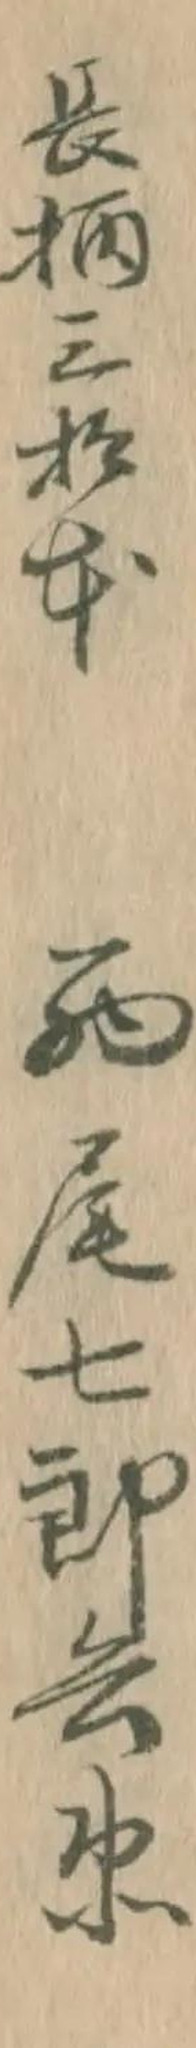長柄三拾本西尾七郎兵衛
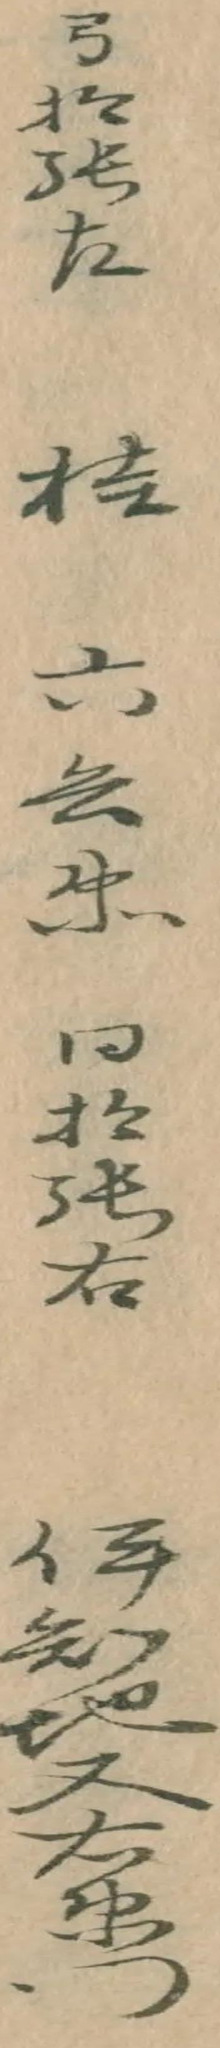弓拾張左桂六兵衛同拾張右伊知地又右衛門

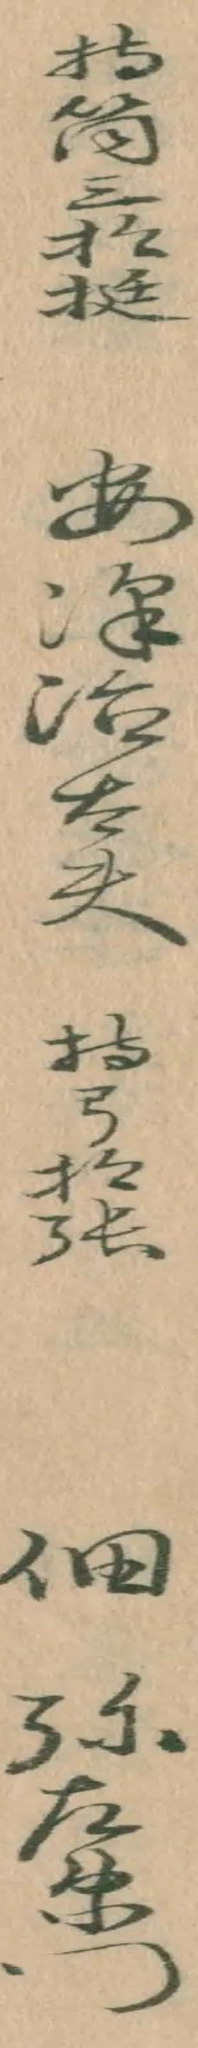持筒三拾挺安沢治太夫持弓拾張佃弥左衛門
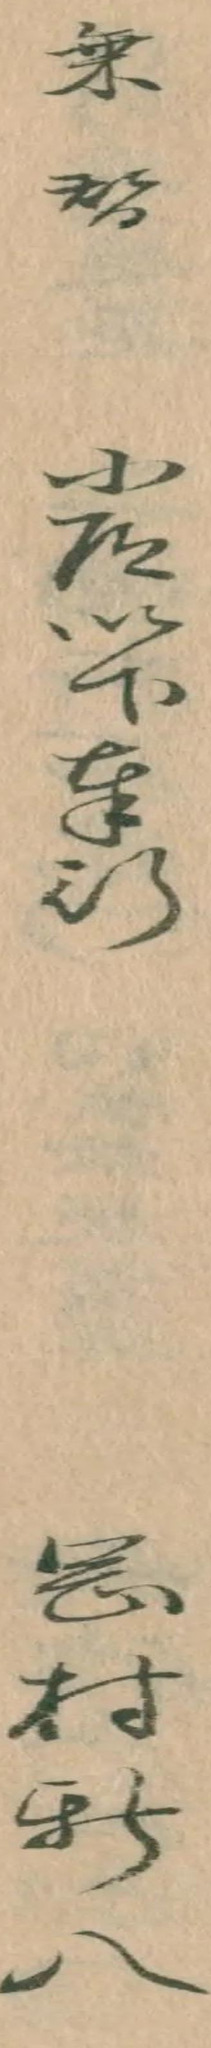乗替小道以下奉行岡村新八
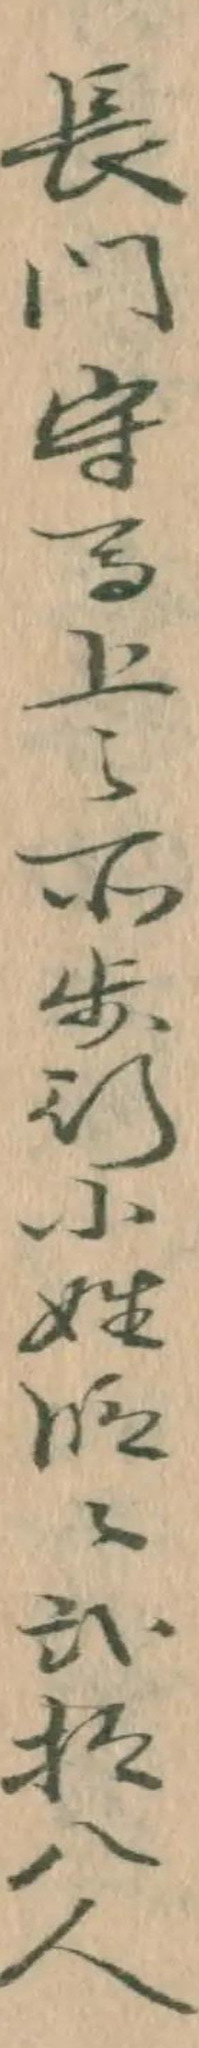長門守馬上之所歩行小姓段々弐拾八人
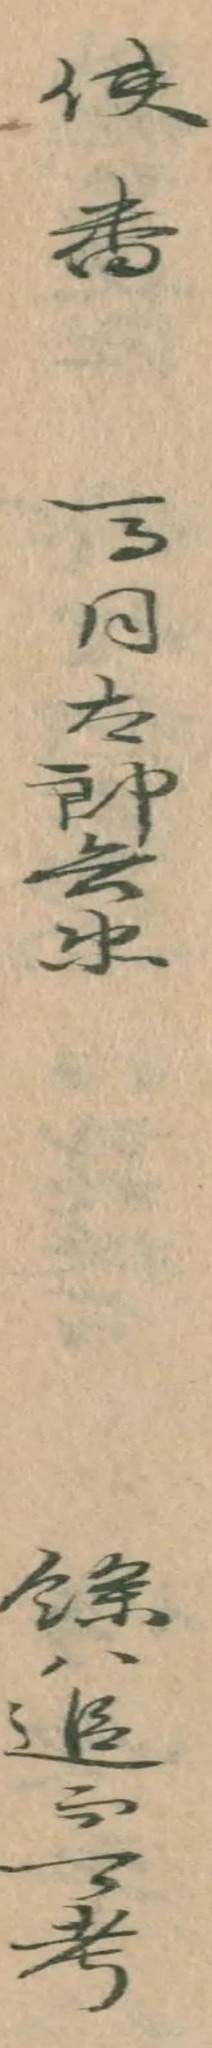使番馬月太郎兵衛余は追而可考
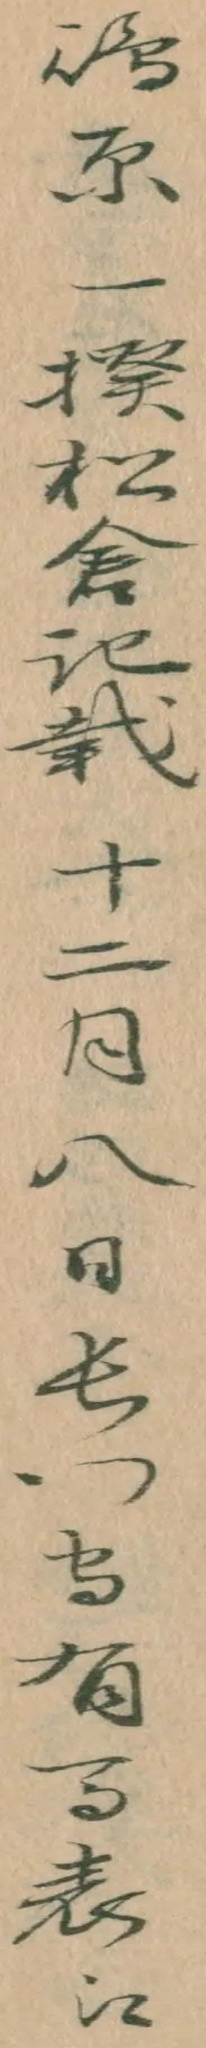島原一揆松倉記載十二月八日長門守有馬表江
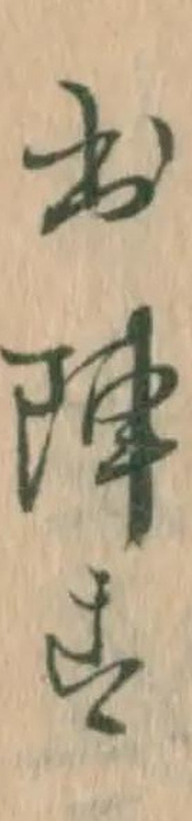出陣す
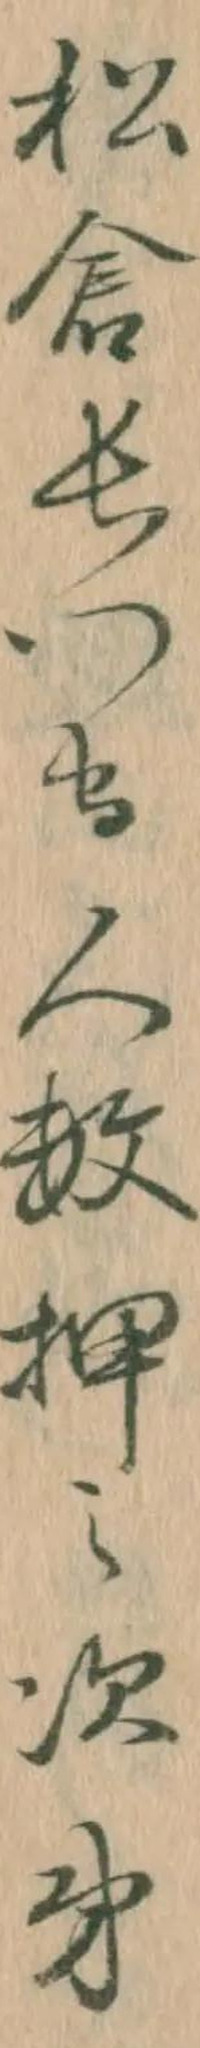松倉長門守人数押之次第
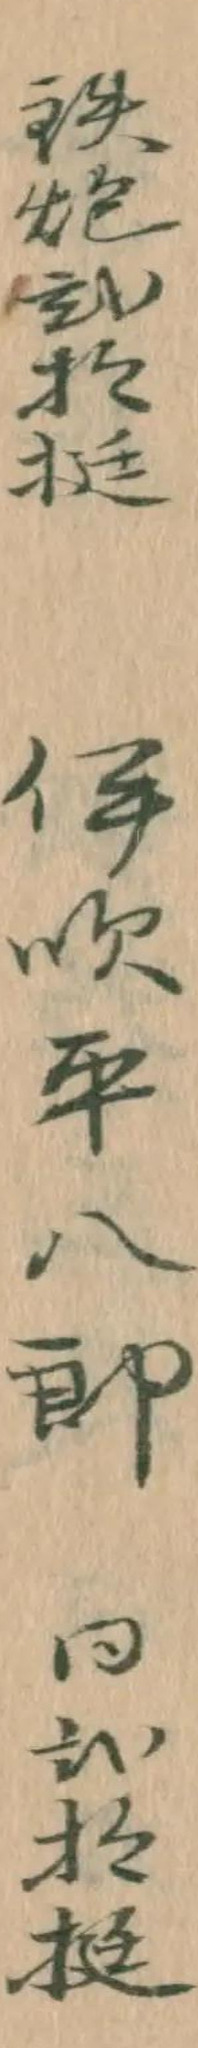鉄炮弐拾挺伊吹平八郎同弐拾挺
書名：切支丹御退治記 49巻. [3]
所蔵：国立国会図書館 National Diet Library, JAPAN
